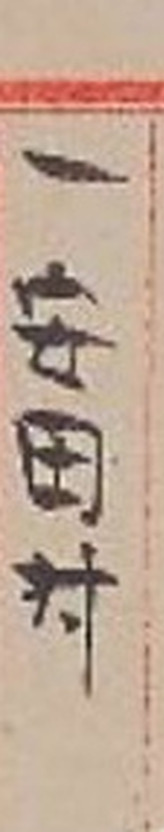一安田村
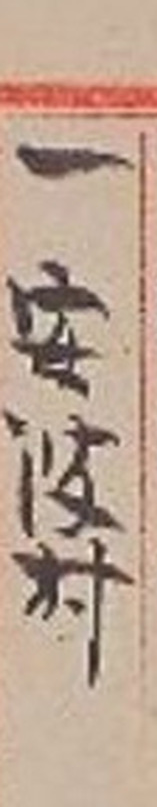一安波村
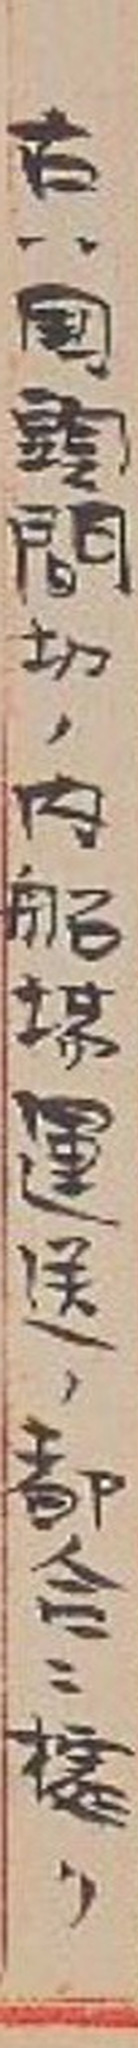右ハ国頭間切ノ内船場運送ノ都合ニ拠リ
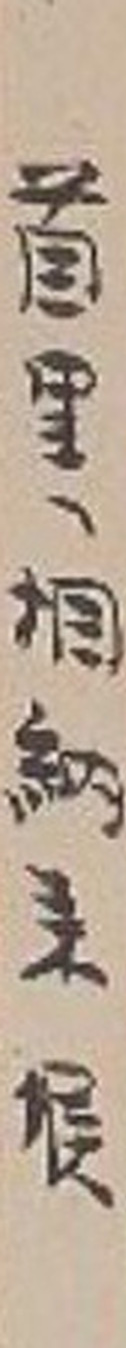首里ヘ相納来候
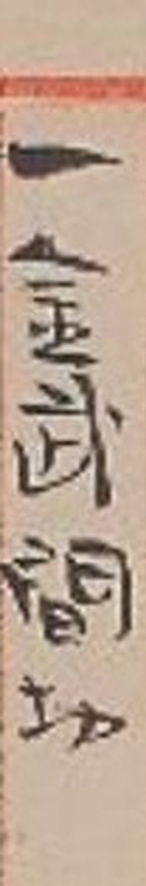一金武間切
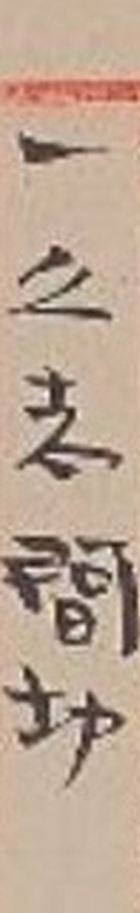一久志間切
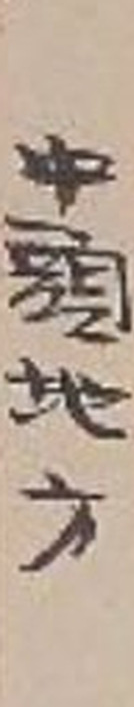中頭地方
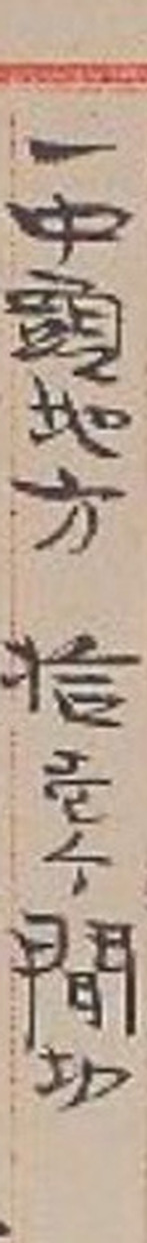一中頭地方拾壱ヶ間切
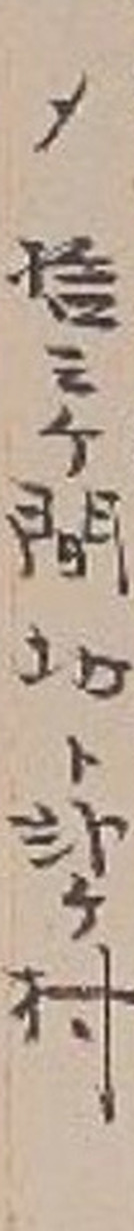〆拾三ヶ間切ト弐ヶ村

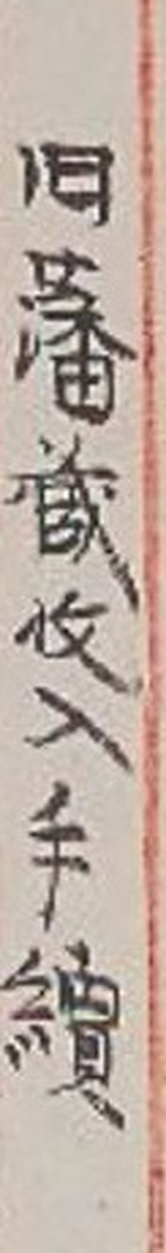旧藩蔵収入手続
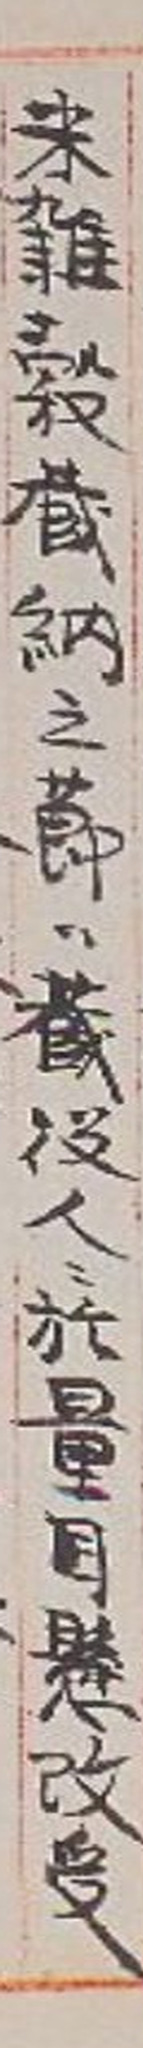米雑穀蔵納之節ハ蔵役人ニ於量目懸改受
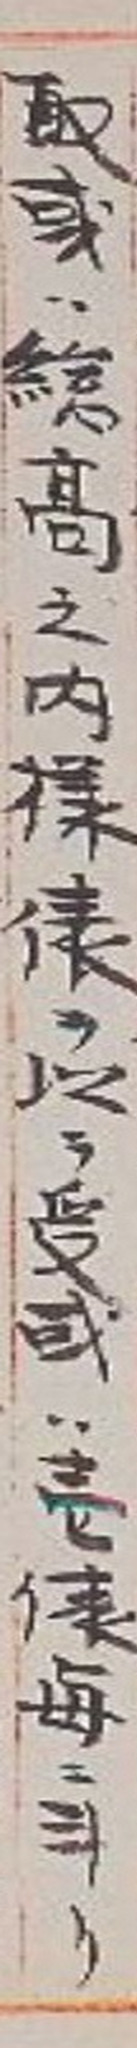取或ハ総高之内様俵ヲ以テ受或ハ壱俵毎ニ斗リ
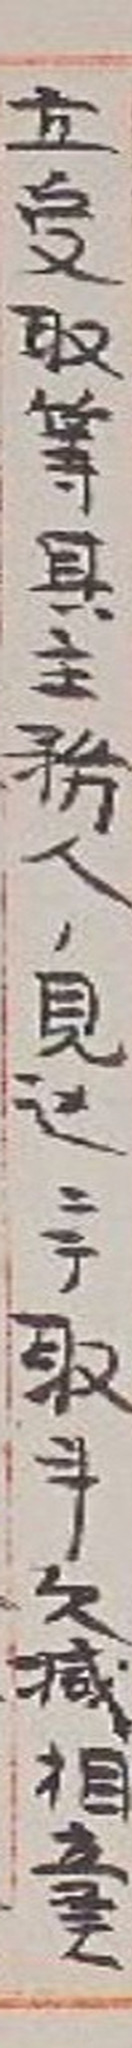立受取等其主務人ノ見込ニテ取斗欠減相立候
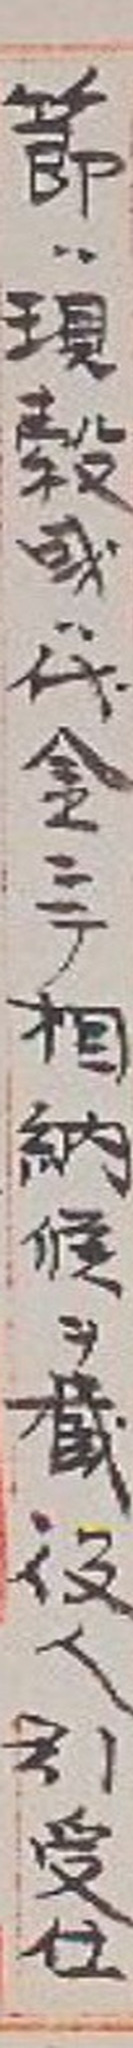節ハ現穀或ハ代金ニテ相納候ヲ蔵役人引受仕
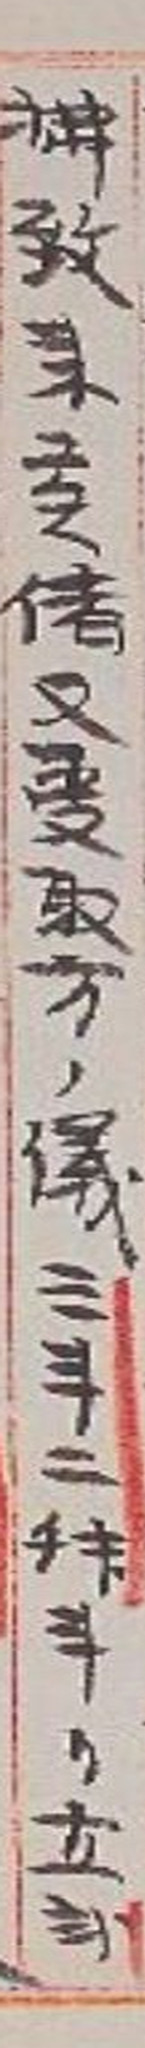払致来候偖又受取方ノ儀三斗二升斗リ立弐
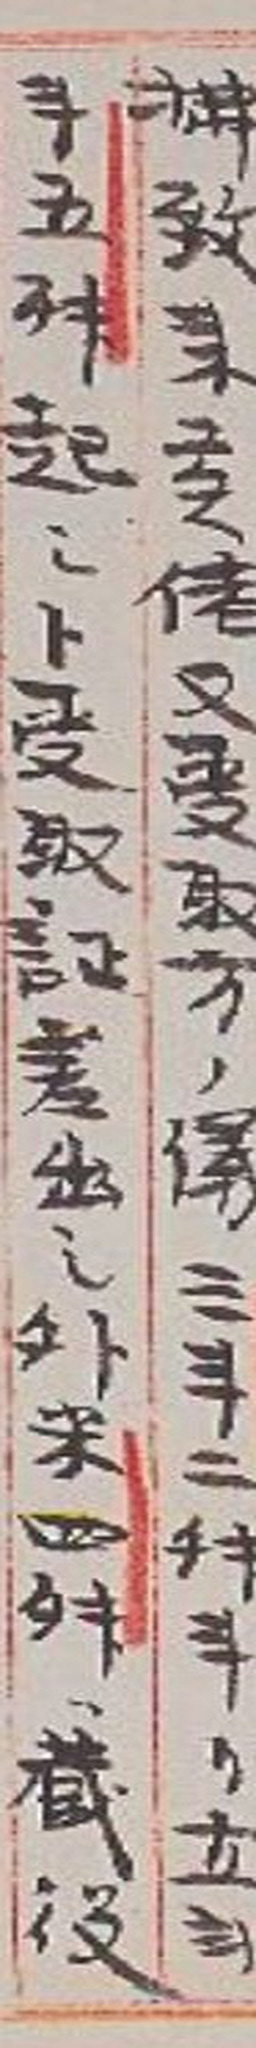斗五升起シト受取証差出シ外米四升ハ蔵役
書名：貢納物品領収旧藩慣例並ニ置県後取扱順序
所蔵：University of the Ryukyus Library
